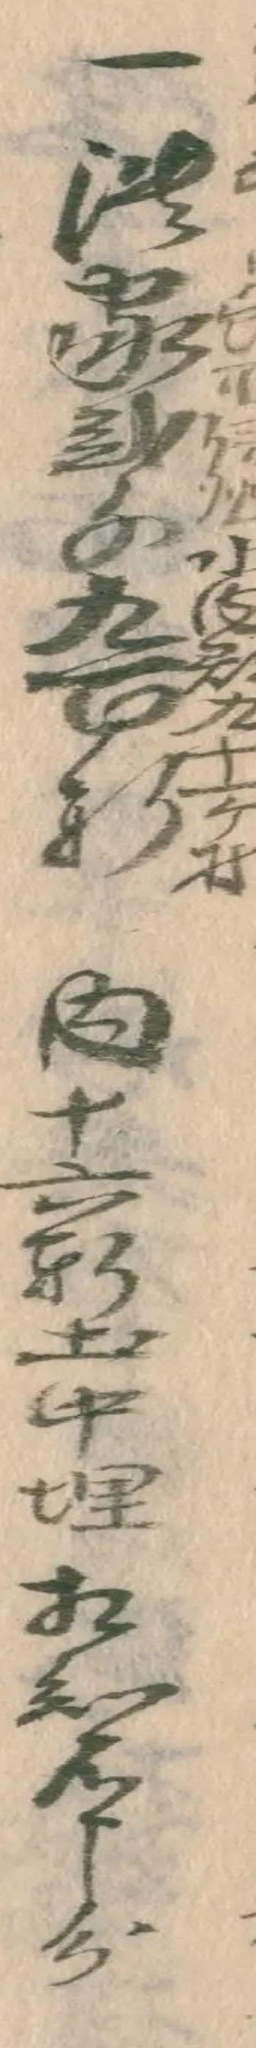一潰家弐千九百軒内十六軒土中埋相知不申分
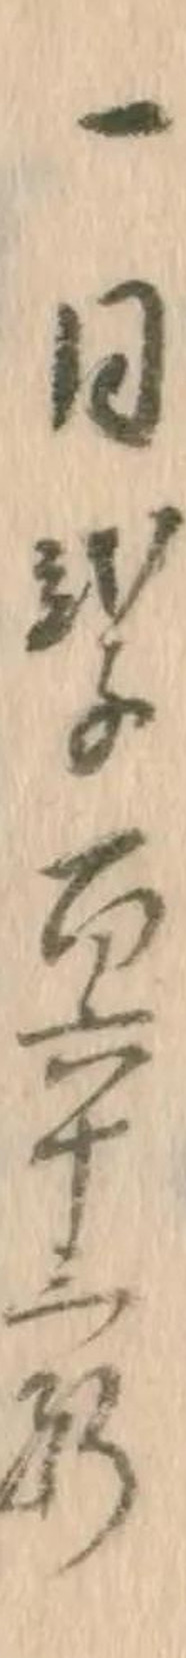一同弐千百六十三軒
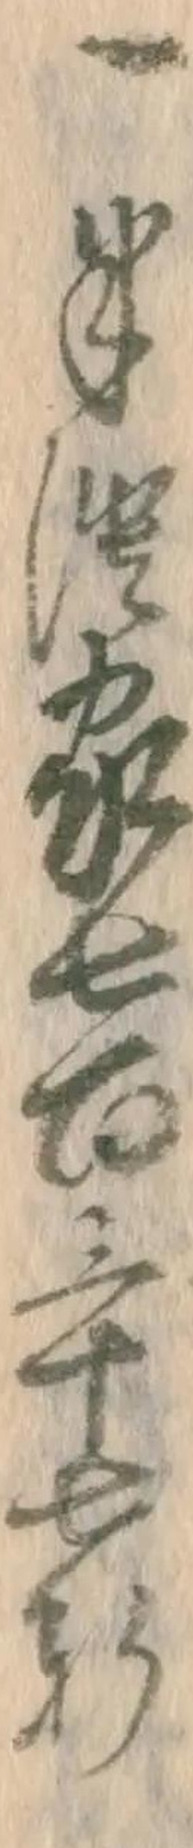一半潰家七百三十七軒
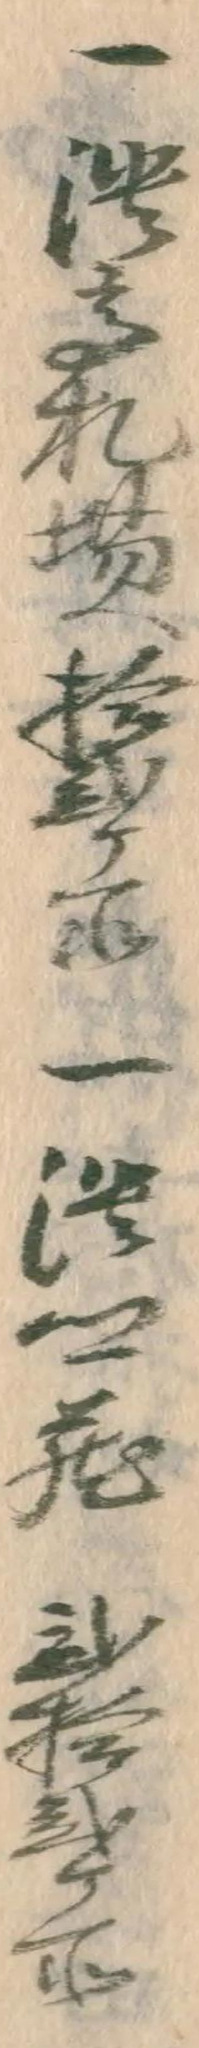一潰高札場拾弐ケ所一潰郷蔵弐拾弐ケ所
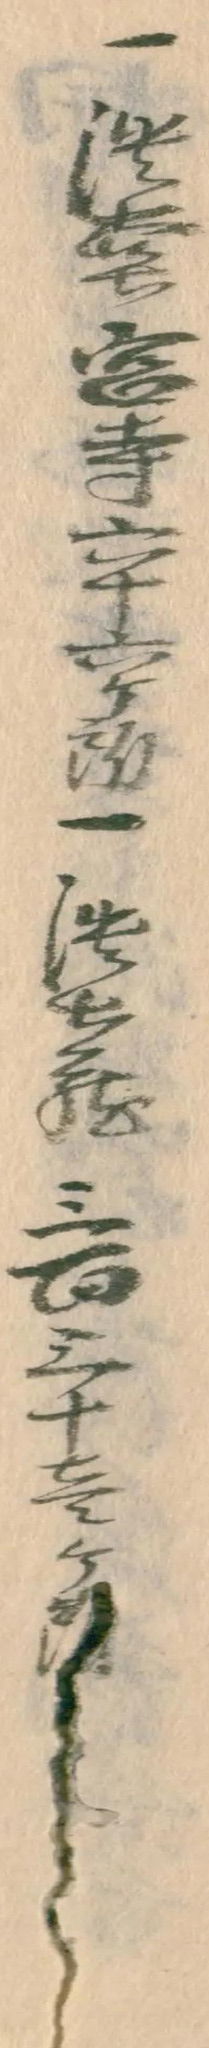一潰堂宮寺潰六十六ケ所一潰土蔵三百三十壱ケ所
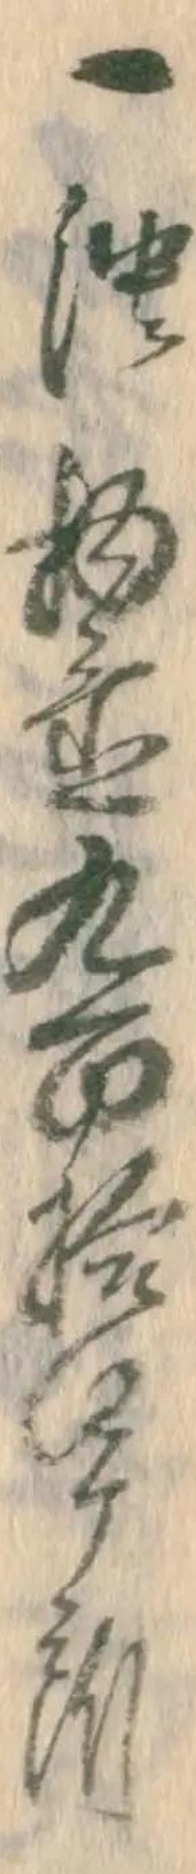一潰物置九百拾四ケ所
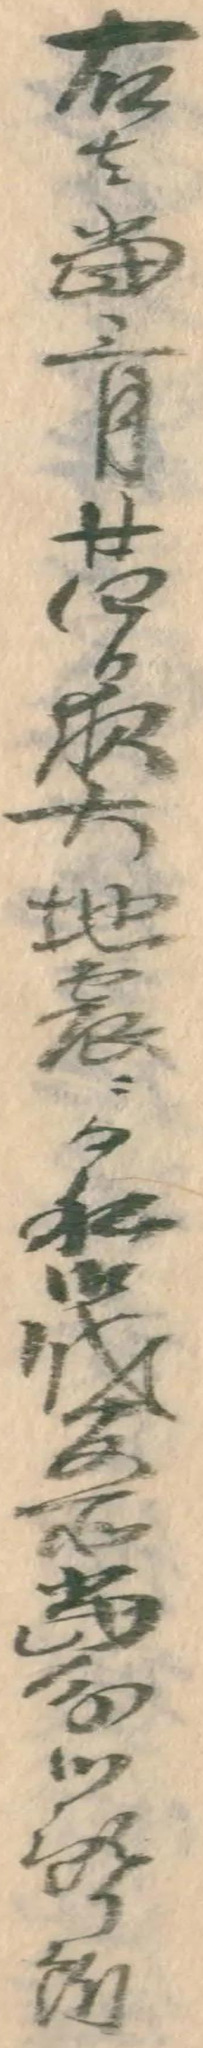右者当三月廿四日夜大地震二而私御代官所当分御預り所
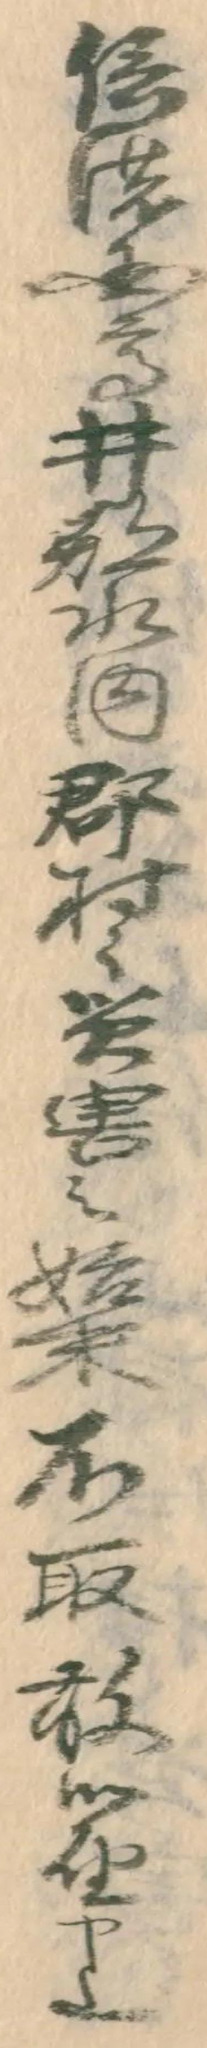信濃国髙井郡水内郡村々災害之始末不取敢御届申上

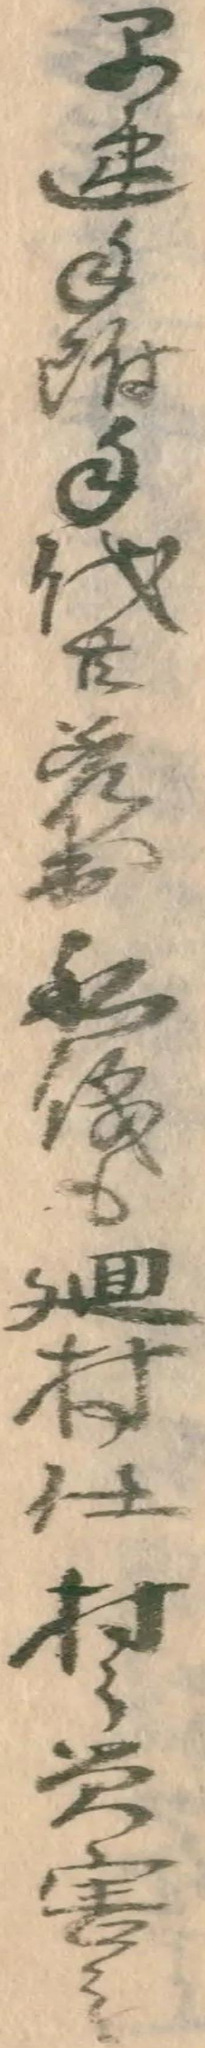早速手附手代共手配差出私儀も廻村仕村々災害之
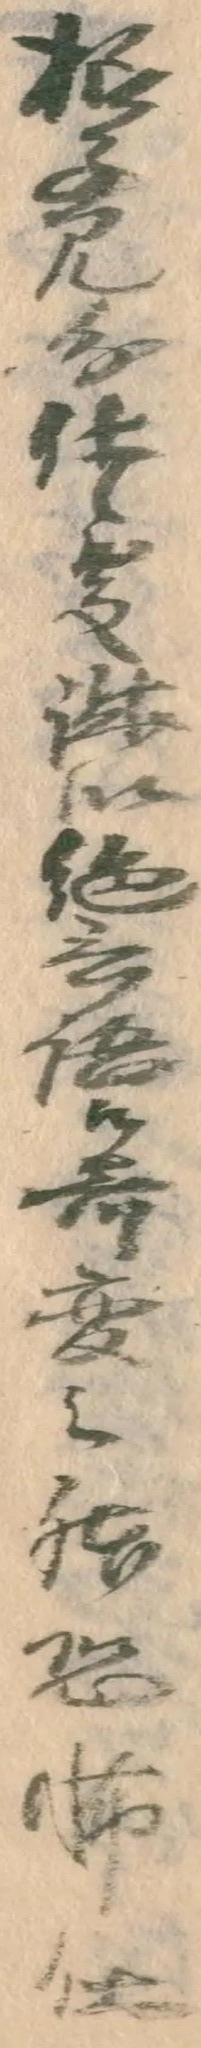様子見分仕候処誠ニ以絶言語奇変之躰恐怖仕
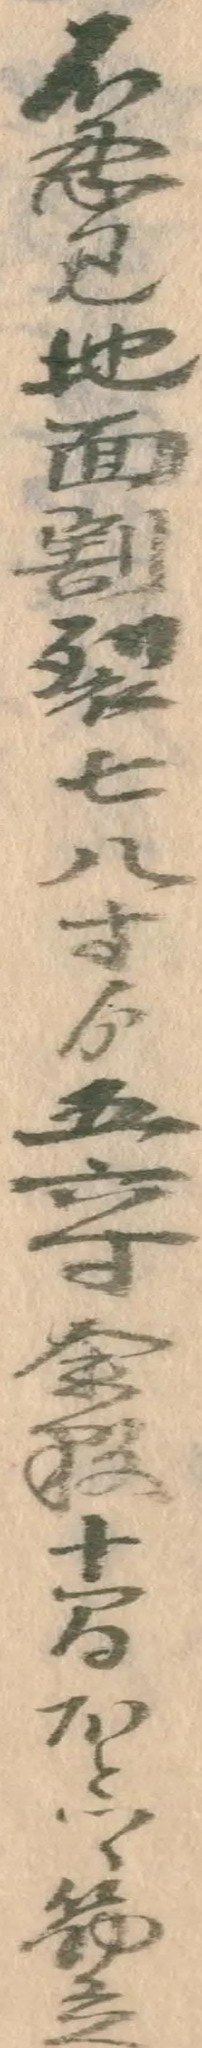不忍見地面割裂七八寸ゟ五六寸余数十間ほとッゝ筋立
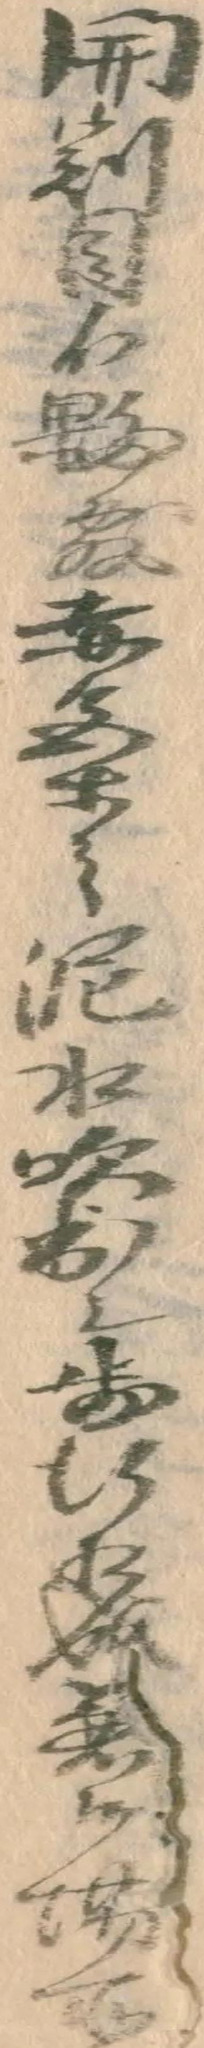開割目ゟ夥敷赤色等之泥水吹出し歩行相成兼候場所
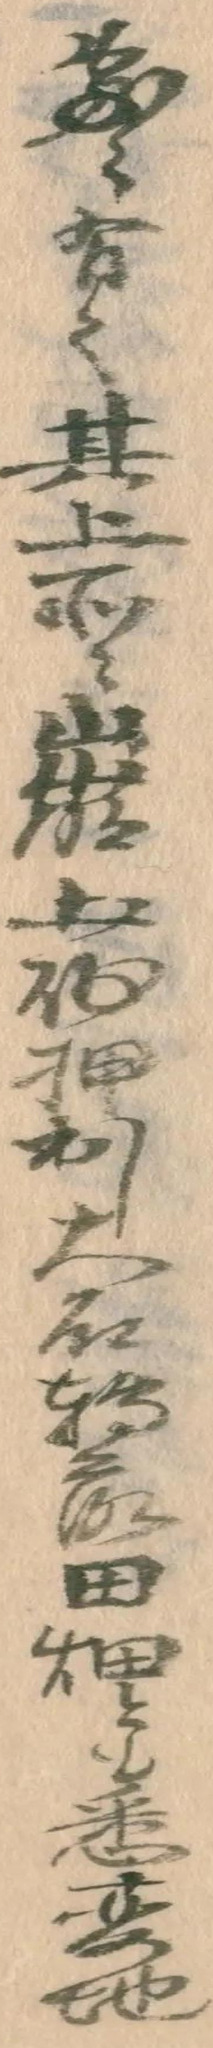多く有之其上所々山崩土砂押出し大石転落田畑とも悉変地
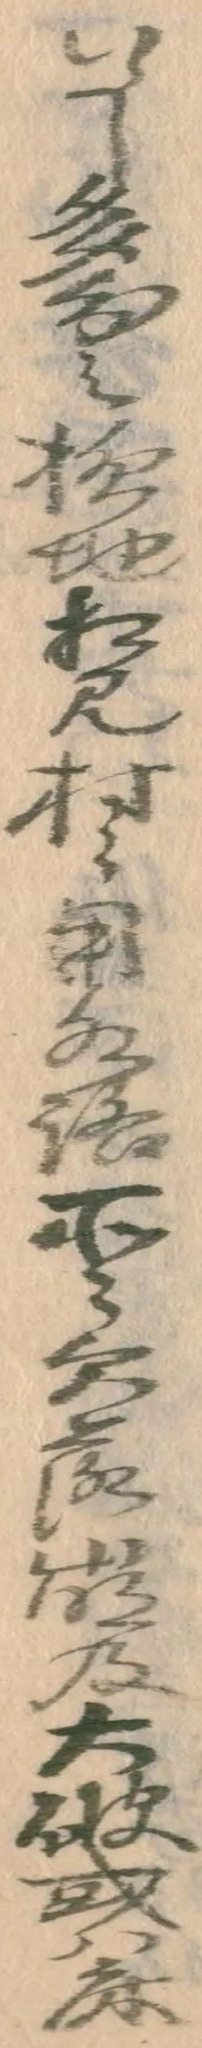いたし多分之損地相見村々用水路所々欠落崩及大破或ハ床
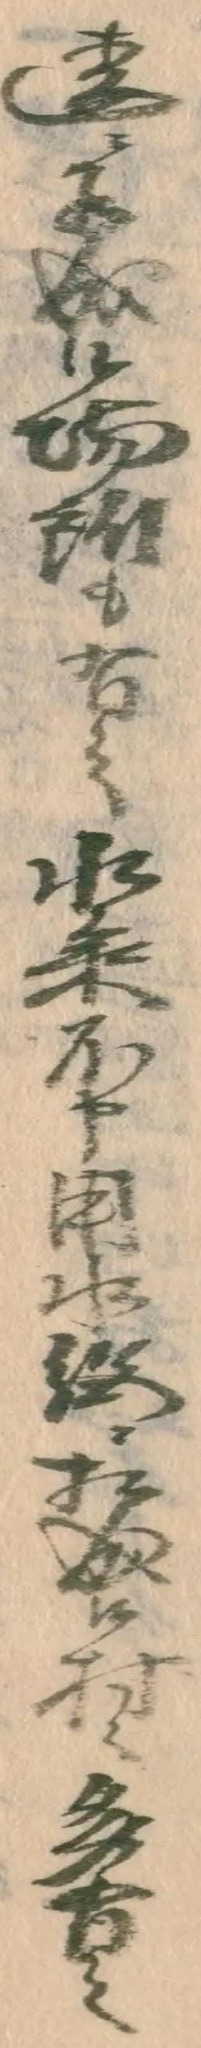違ニ相成候場所も有之水乗不申用水路二相成候村々多分有之
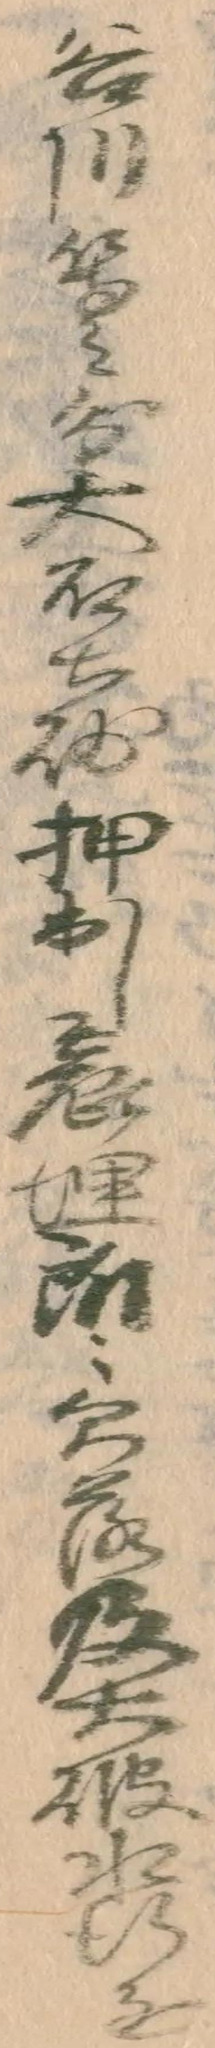谷川等之分大石土砂押出し震埋所々欠落及大破水行を
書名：信州大地震之記
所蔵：国立国会図書館 National Diet Library, JAPAN
